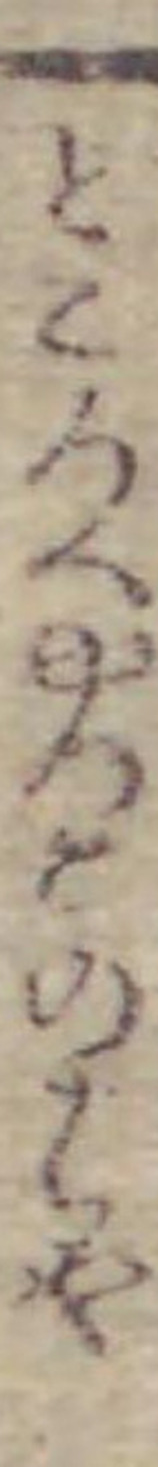ところへやつこのはや
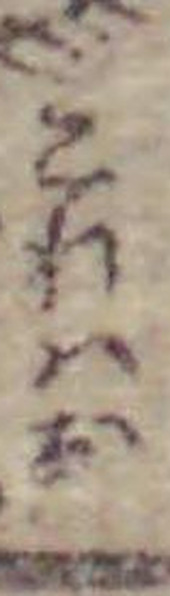これはお
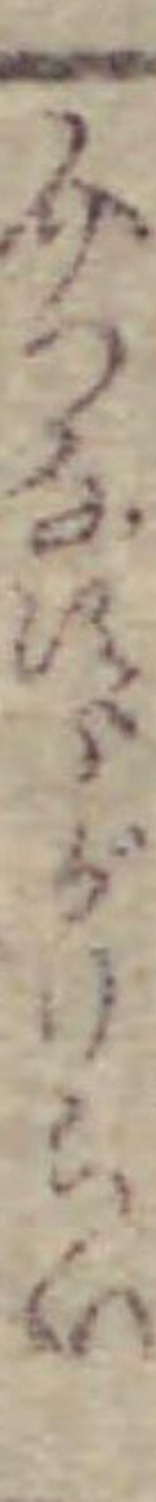介つな次郎がけらい
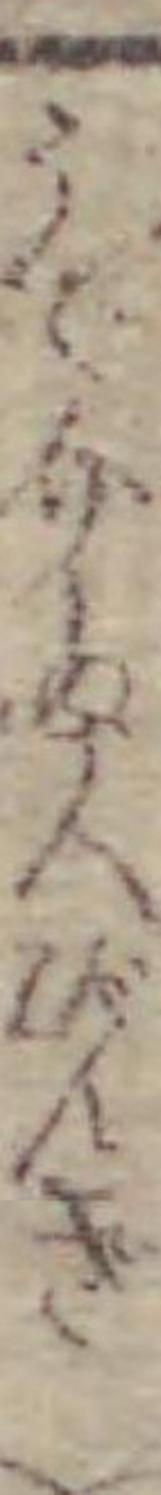うで介両人びんぎ
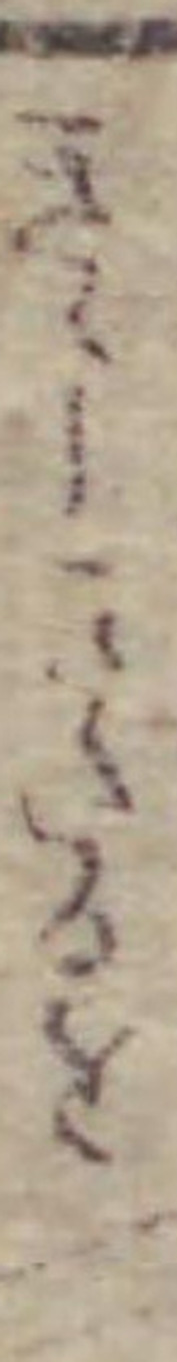きゝしてきたるを
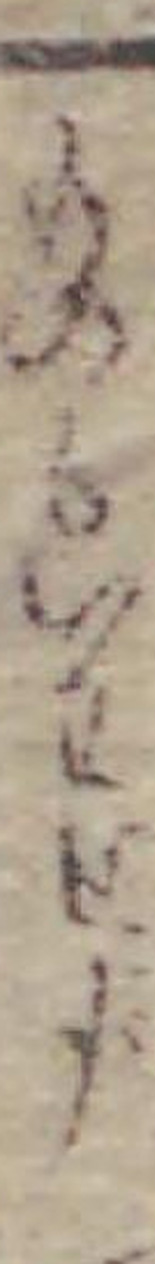ものもいわせず
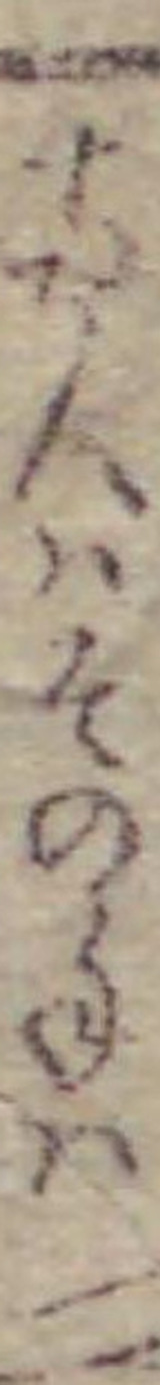両人はその手は
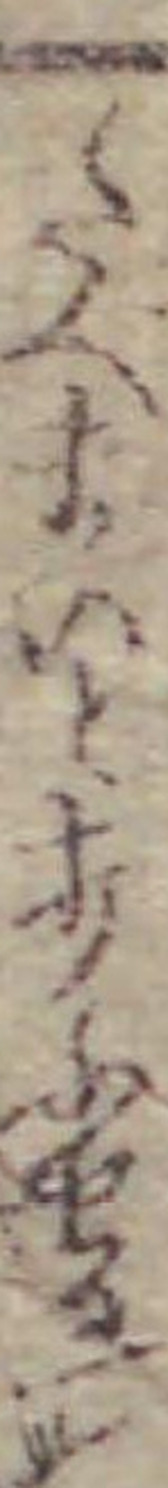たへまいと打ふせる
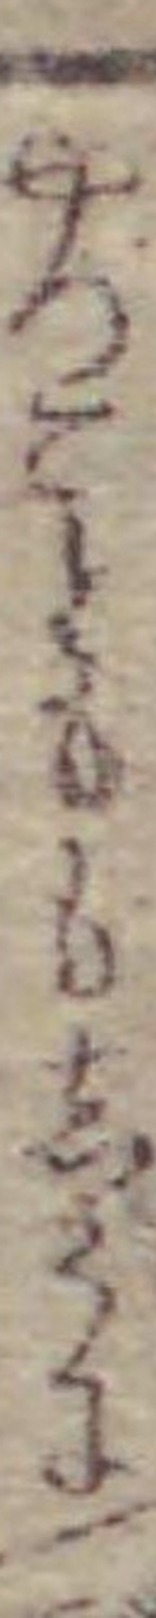やつことももしかに
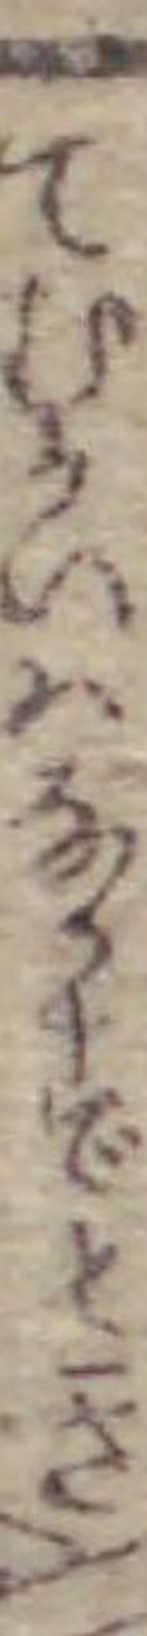てむかいはならずとき
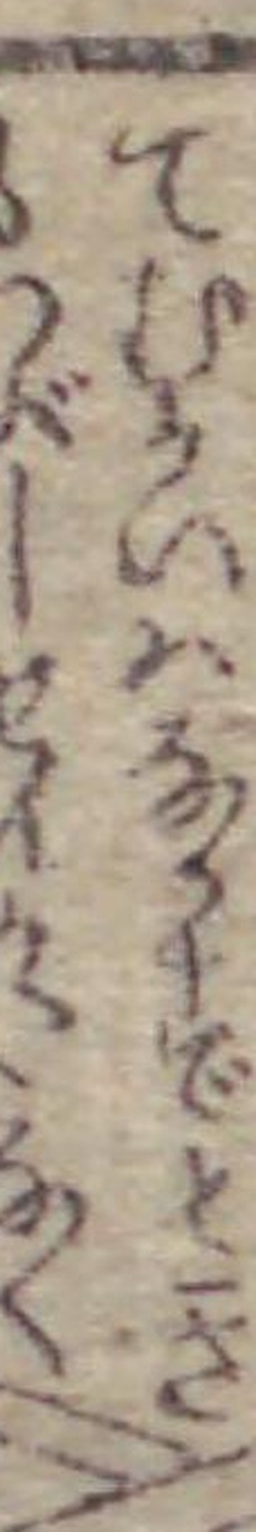もつぶしせんかたなく
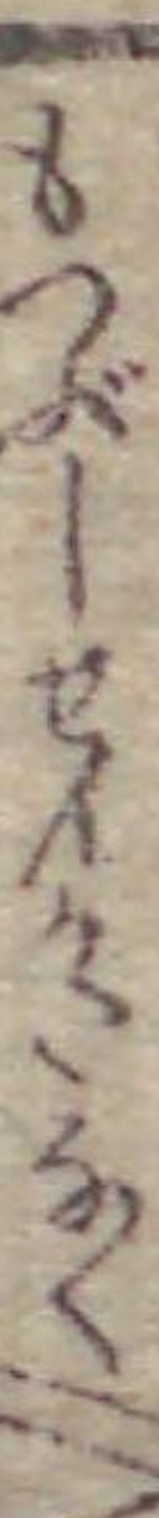もつぶしせんかたなく
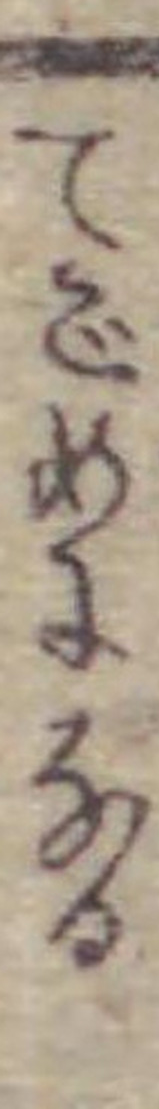てごめになる
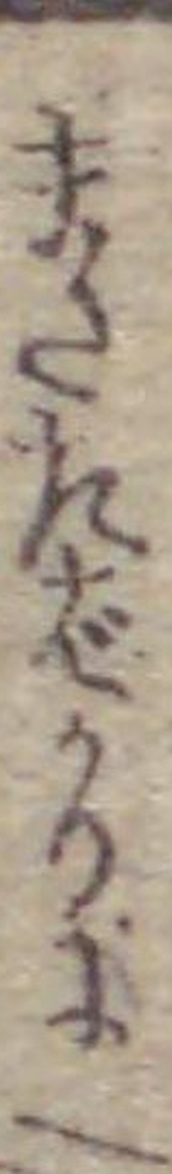またたばかりに
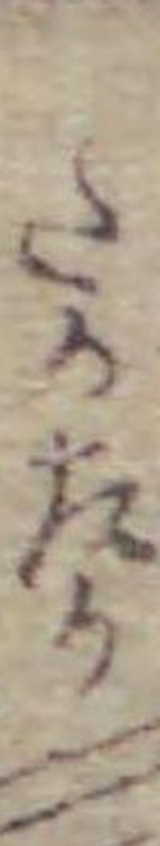たかたか
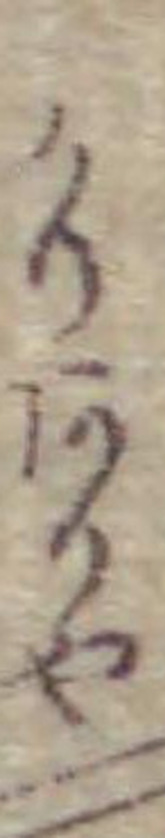かりありや
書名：二日替 : 2巻
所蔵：国立国会図書館 National Diet Library, JAPAN
